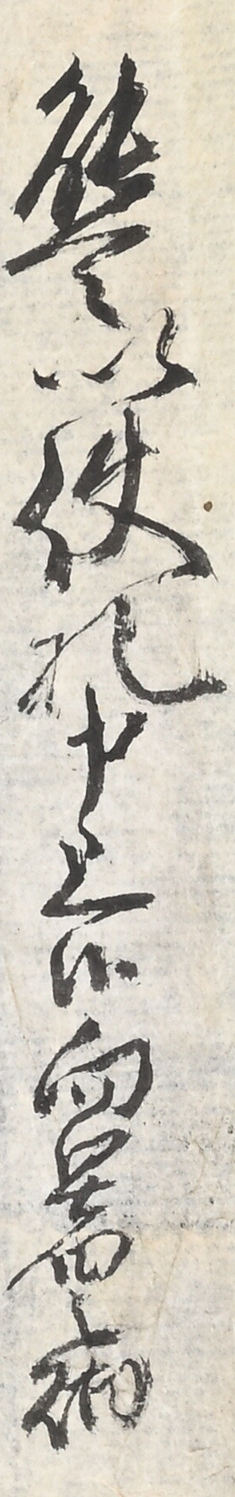態々以使札申上候向暑之砌
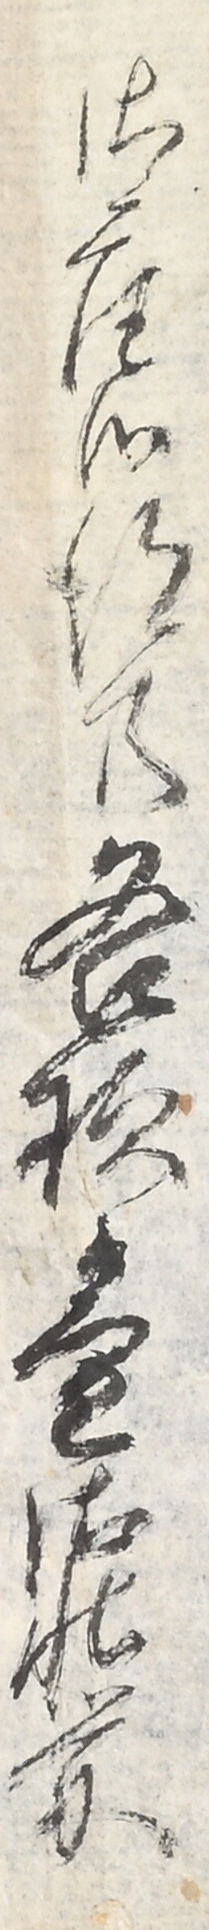御座候得共各様益御壮栄
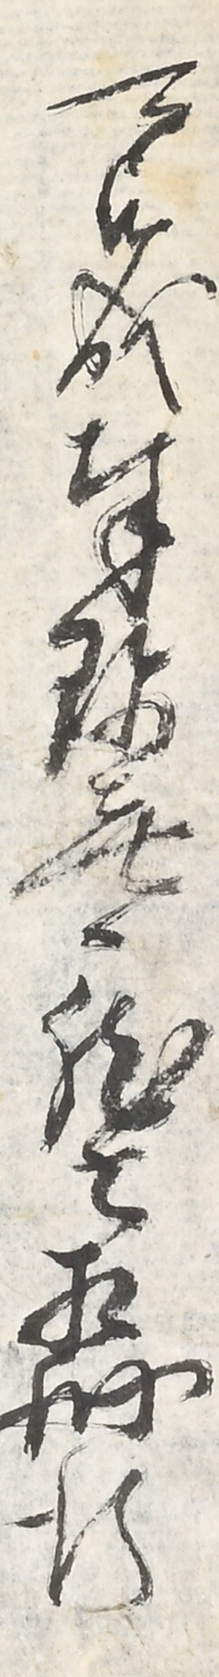可被成奉珍喜候然者相州行
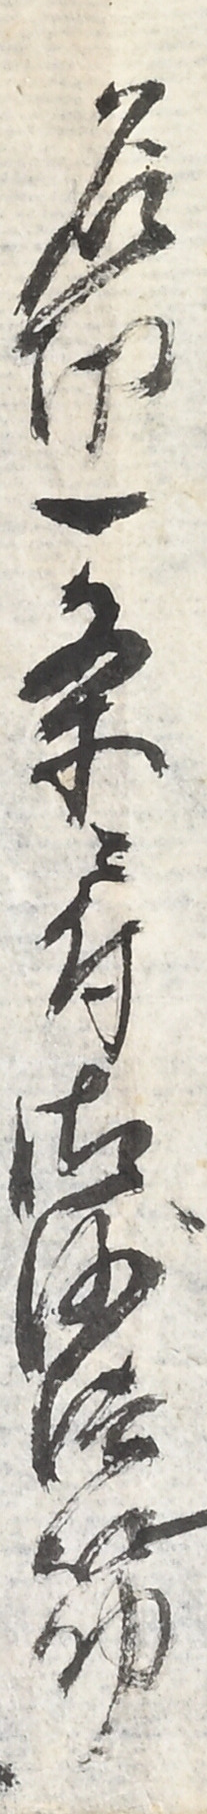石切一条ニ付御沙汰筋
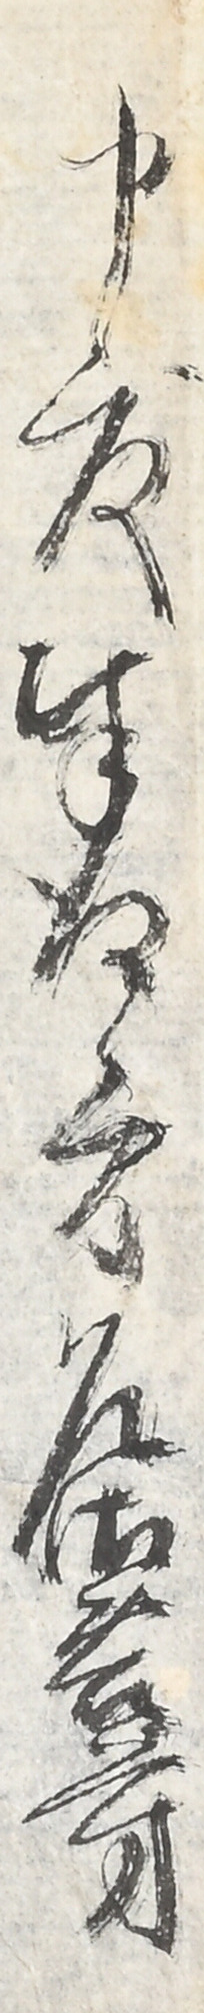申度奉存候間乍御苦労
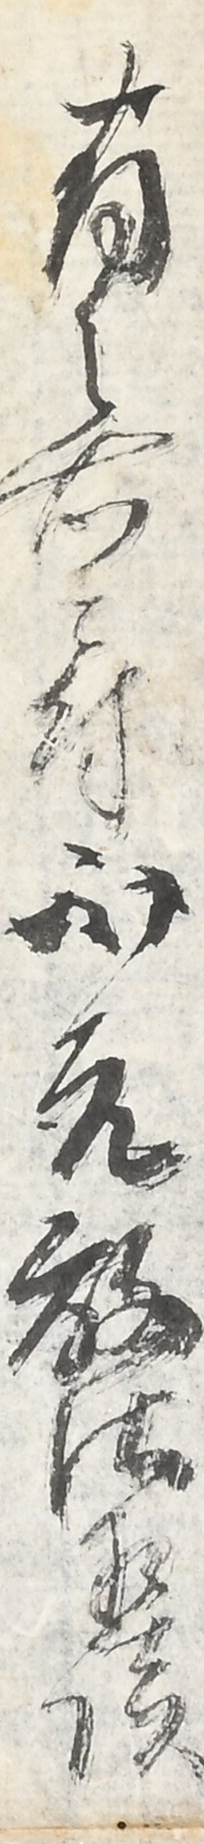有之右ニ付不取敢御相談
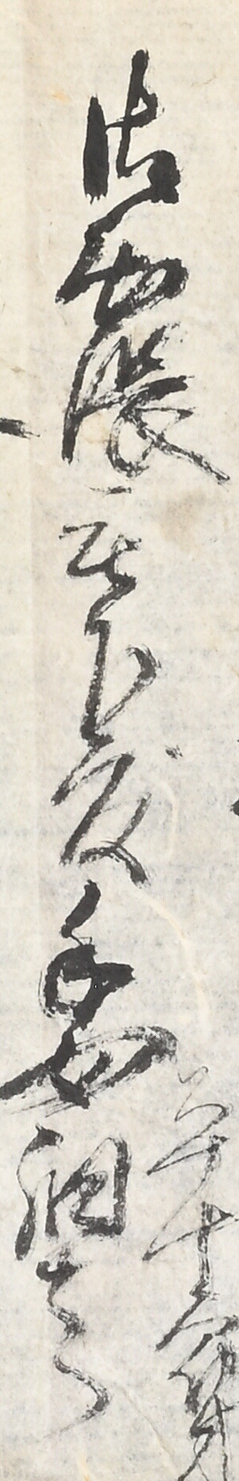御出張被下度委細者
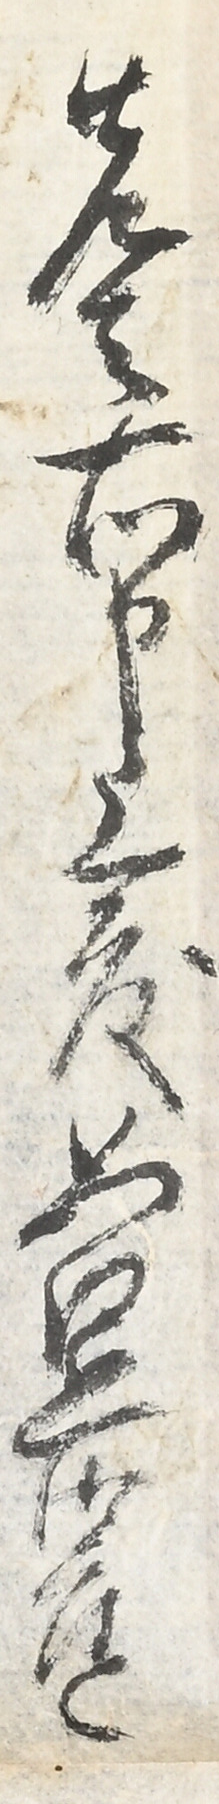先者右申上度如是御座候
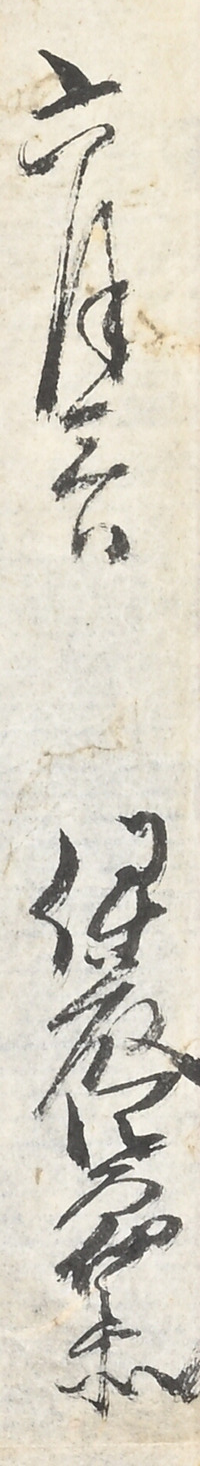六月三日伊藤四郎兵衛
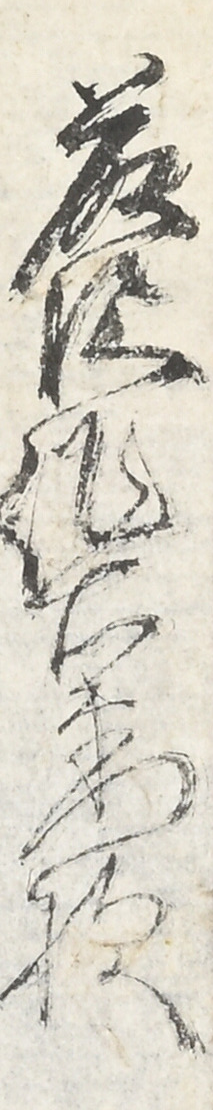藤沢作右衛門様
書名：（書状）
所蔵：伊那市立高遠町図書館・合同会社AMANE
